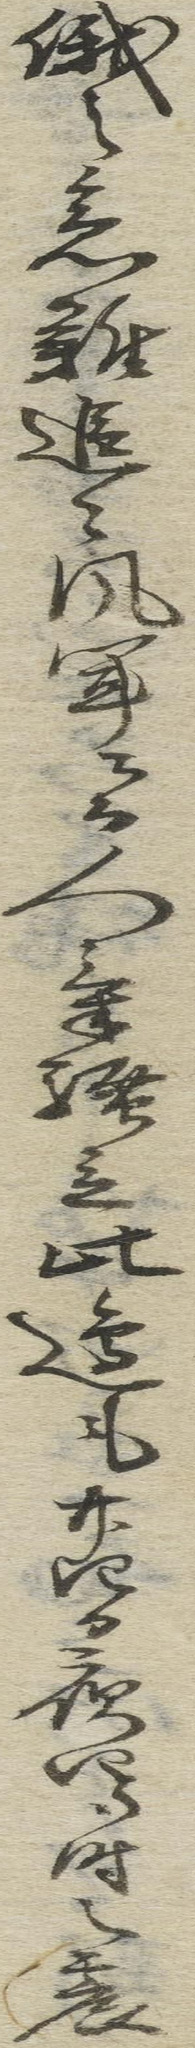俄之急難追々風聞二而人気騒立此辺も廿四日夜四ッ時之震
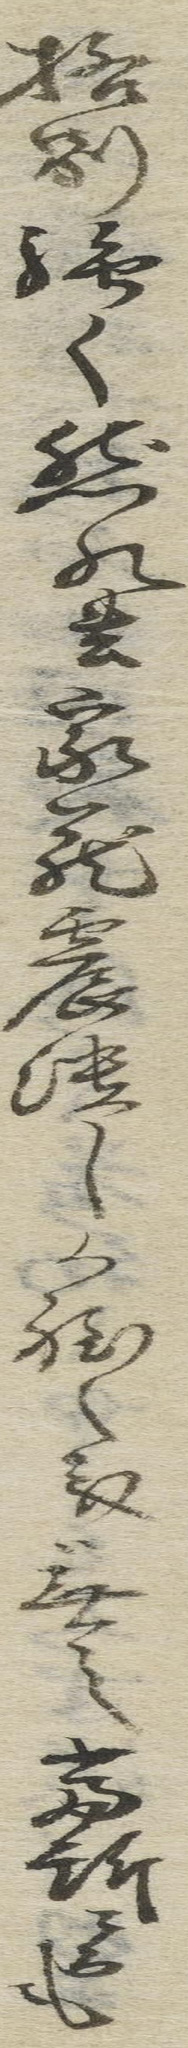格別強く然れ共家蔵潰し候程之義ハ無之当所二而も
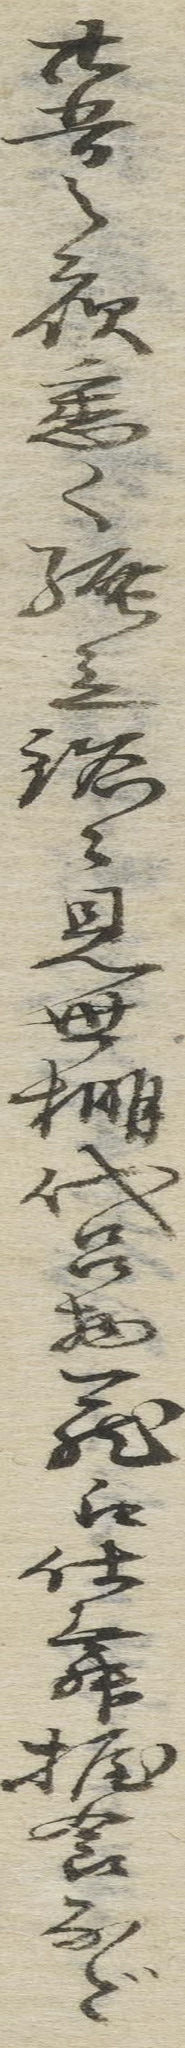廿五日之夜悉く騒立銘々見世棚代呂物蔵江仕舞握食など
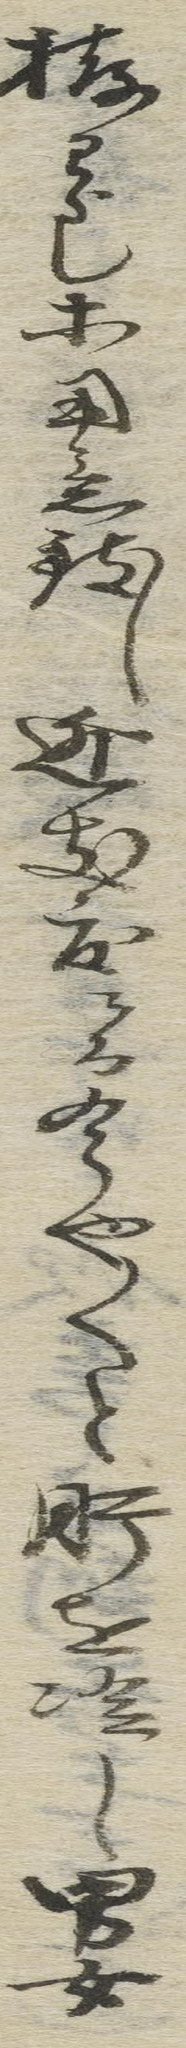拵わらし等用意致し逃支度二而やうやくと肝を冷し男女
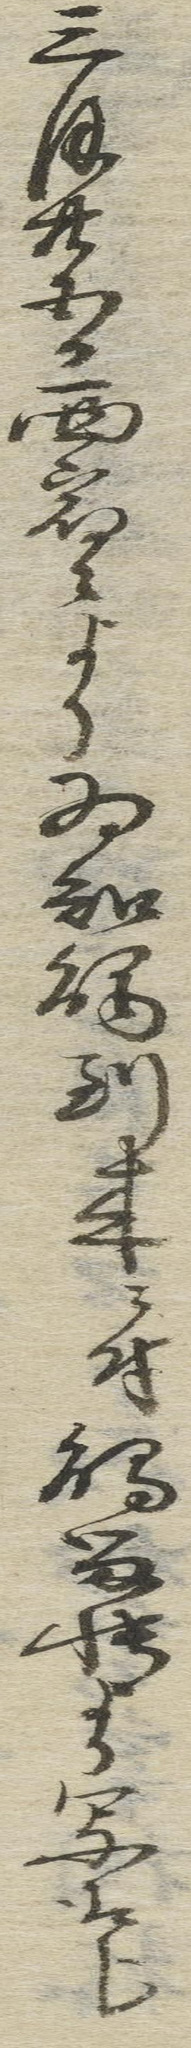三月廿五日西宿より為知觸到来二付觸留状より写取申候
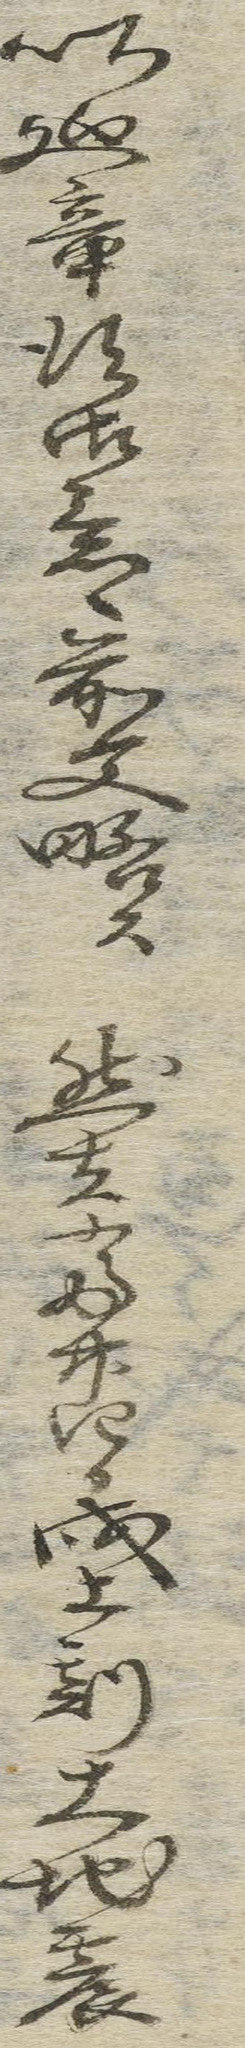以廻章得御意候前文略ス然は当廿四日戌上刻大地震
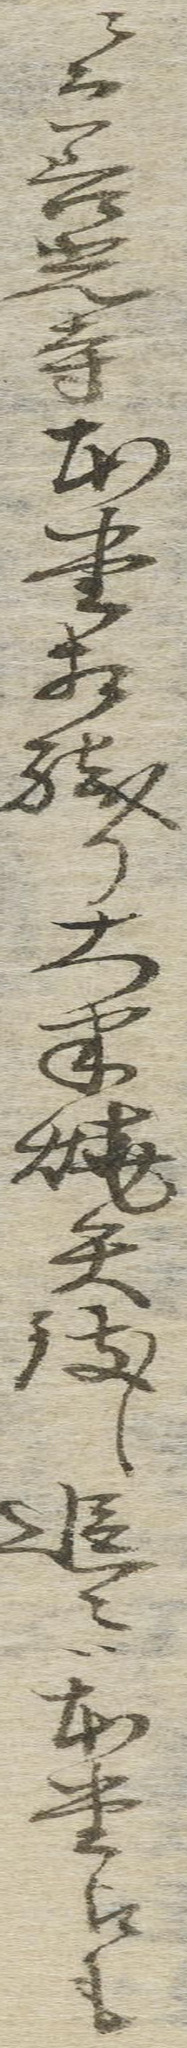二而善光寺本堂相残り大半焼失致し追々本堂江も
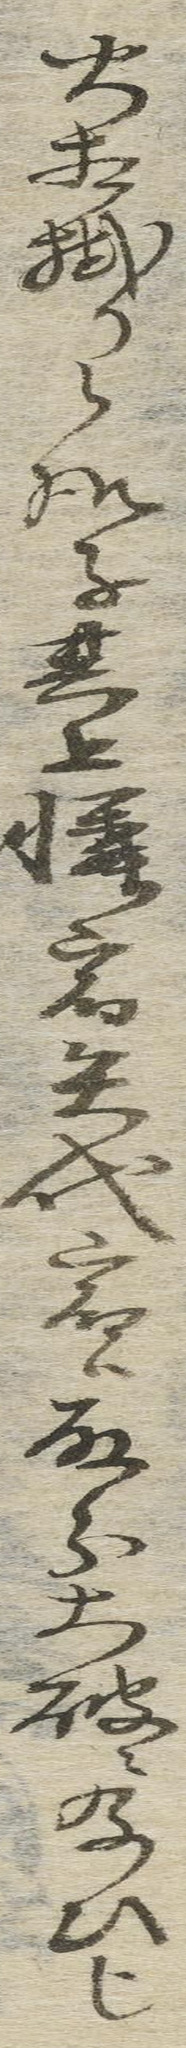火相掛り候様子其上隣り宿矢代宿ハ所分大破二及ひ申候
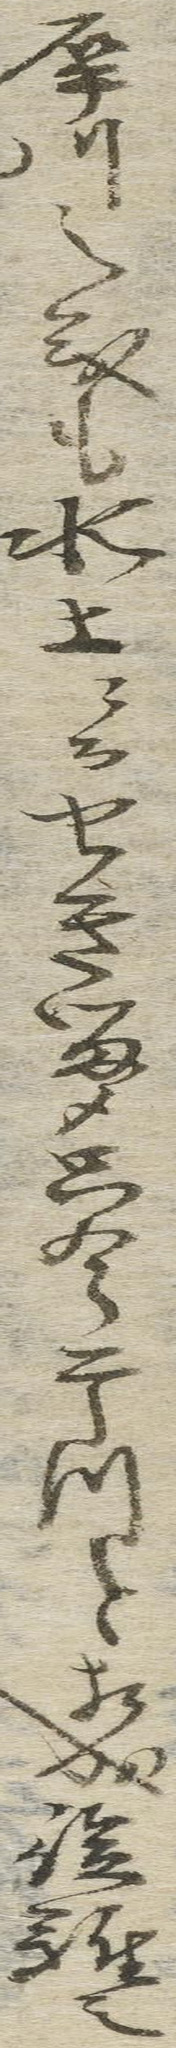犀川之義も水上二而セき留メ只今干川に相成後難之
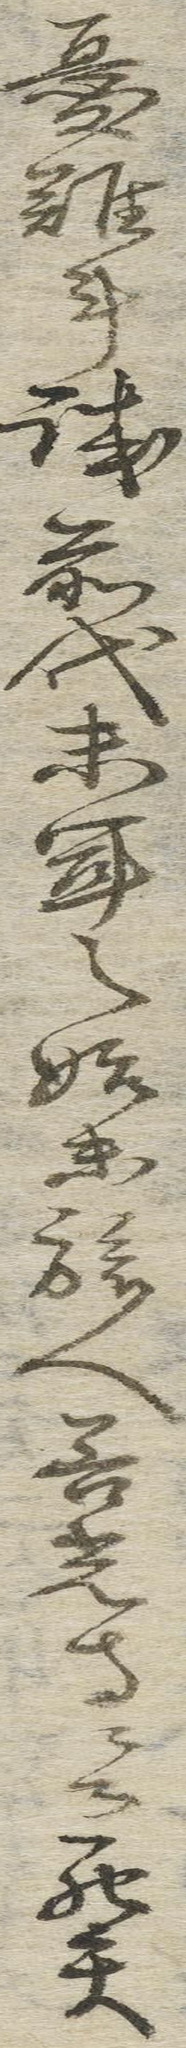憂難計誠前代未聞之始末旅人善光寺二而死失
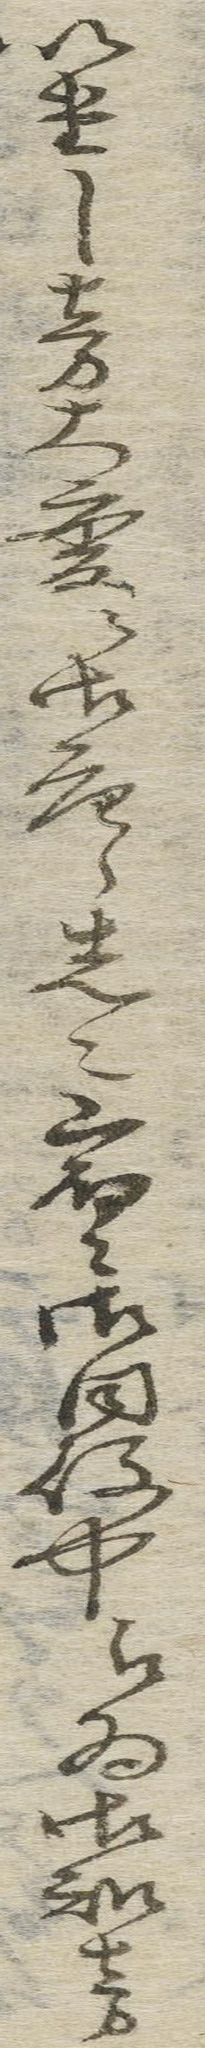いたし旁大変二御座候先々宿々御同役中江為御知旁
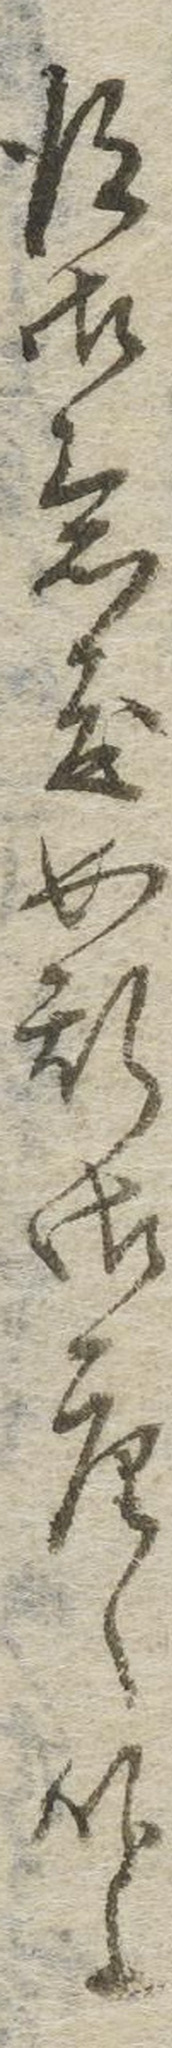得御意度如斯御座候以上
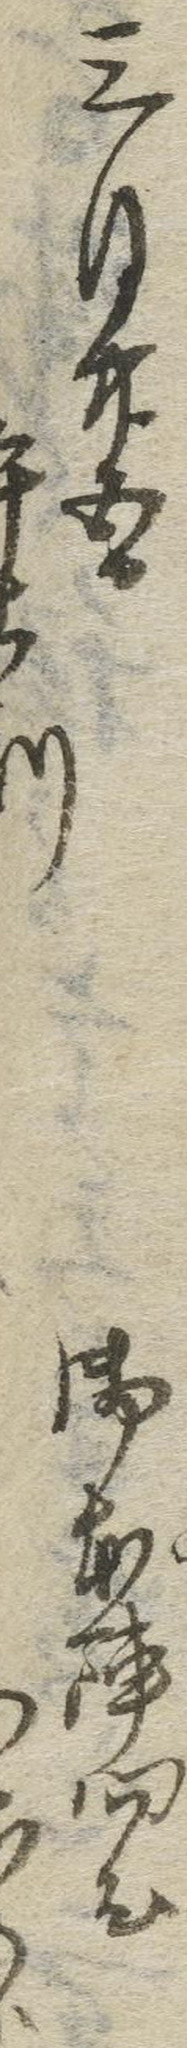三月廿四日御本陣問屋
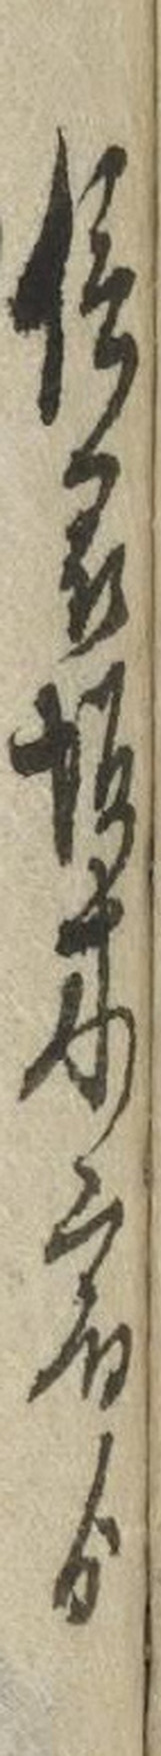信州坂木宿ゟ
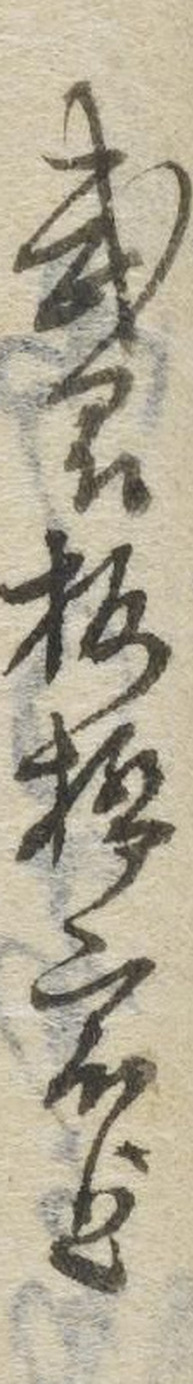武州板橋宿迄
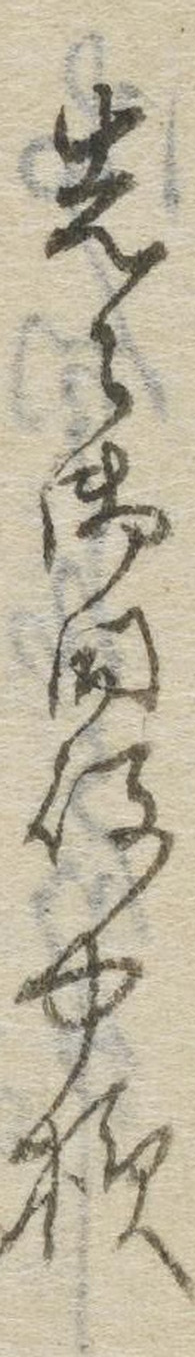先々御同役中様
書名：信濃越後　地震書留
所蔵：東京大学地震研究所図書室 Earthquake Research Institute Library, The University of Tokyo, JAPAN
